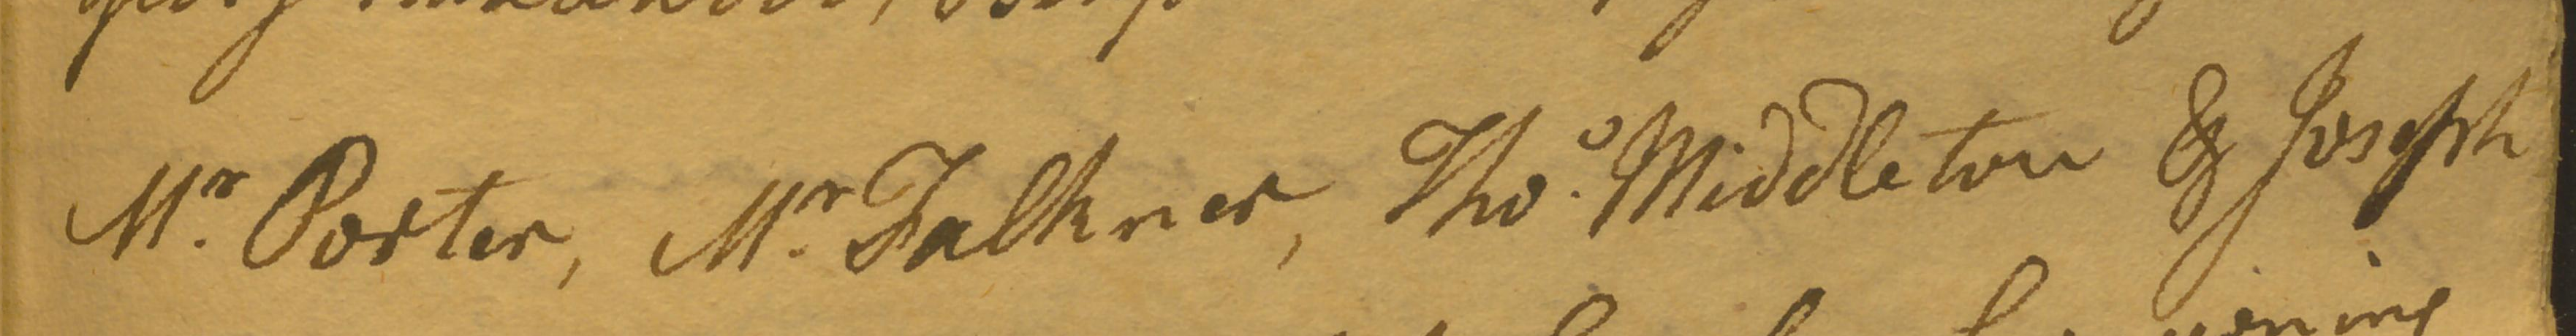M^r. Porter, M^r. Falkner Tho^s. Middleton & Joseph
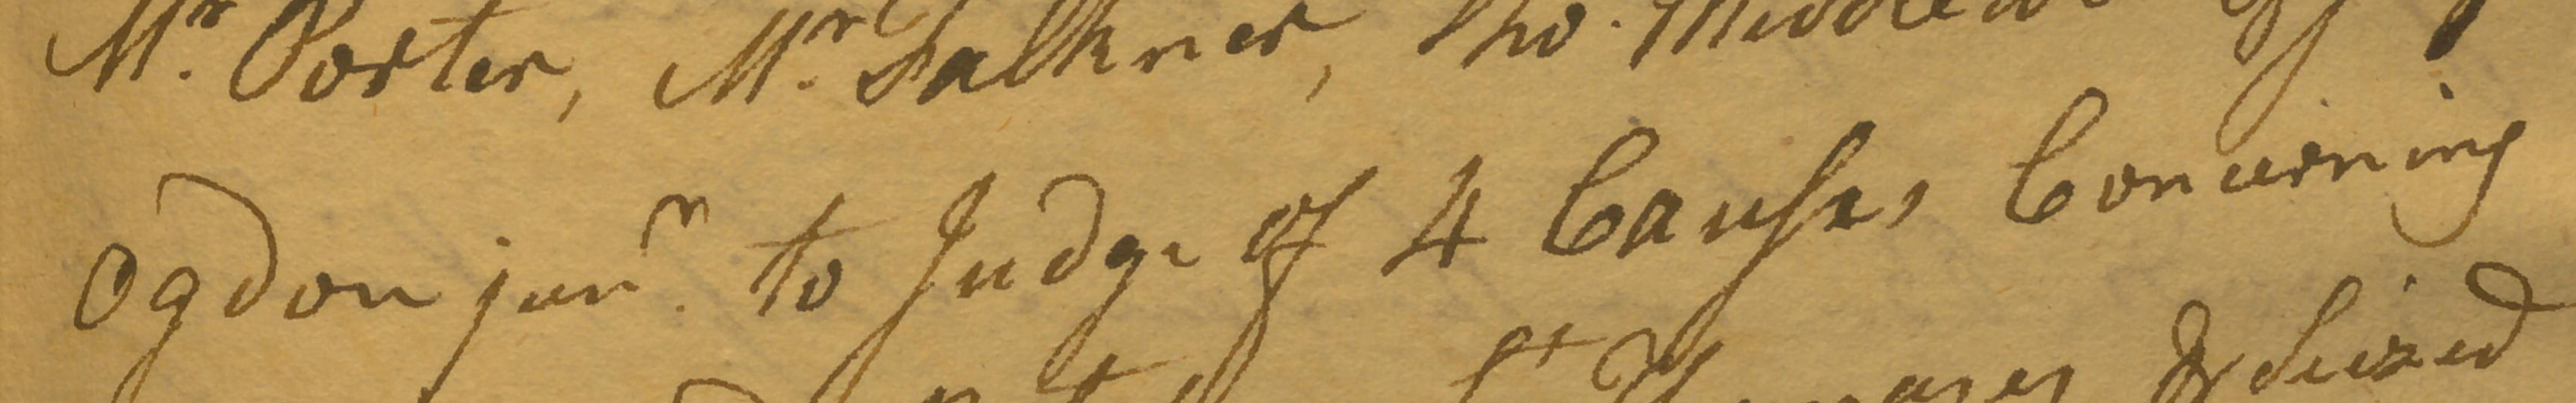Ogdon jun^r. to Judge of 4 Causes Conuerning
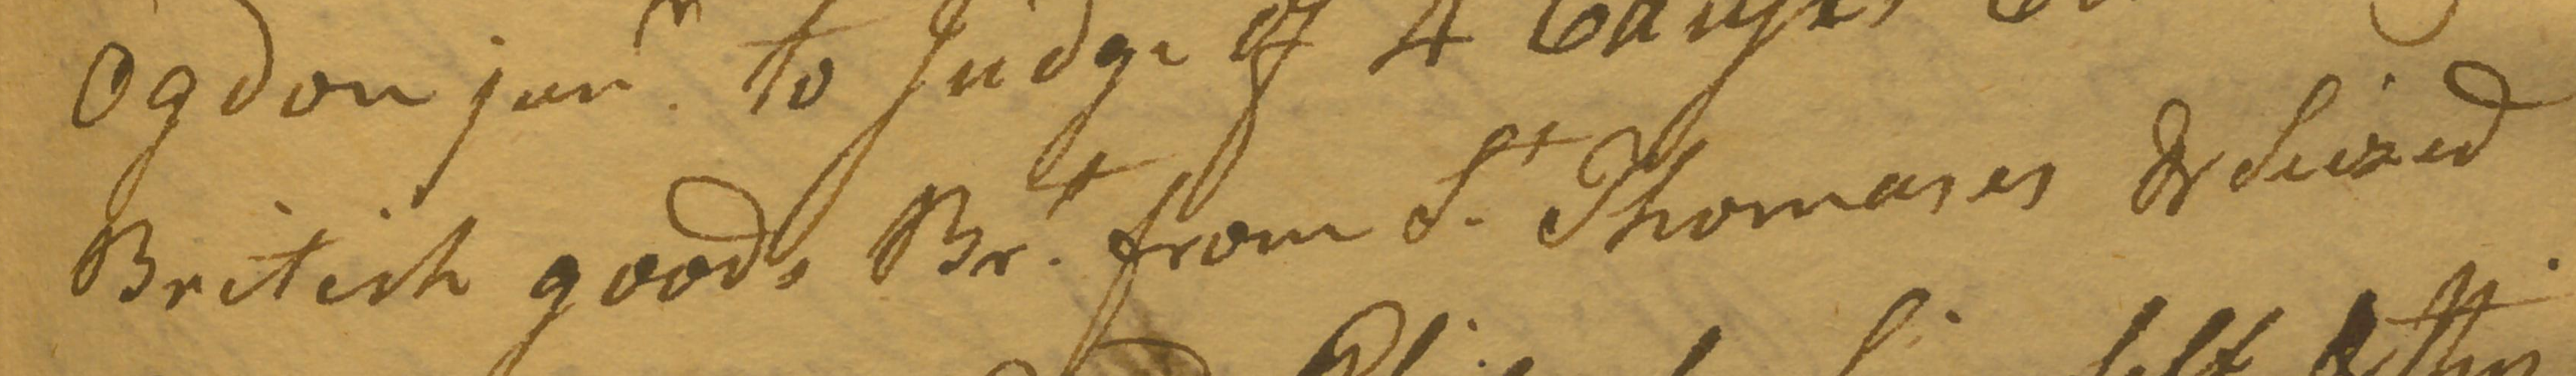British goods Br^t. from S^t. Thomases & Seized
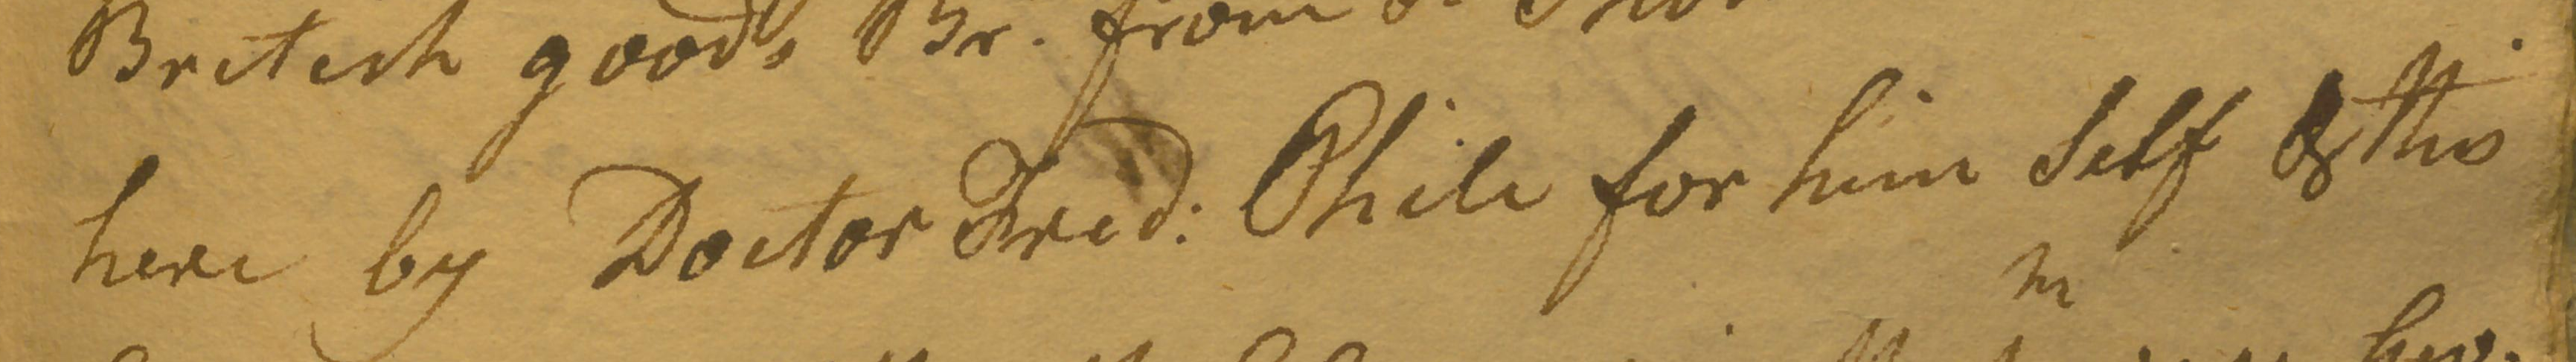here by Doctor Fred: Phile for him self & the
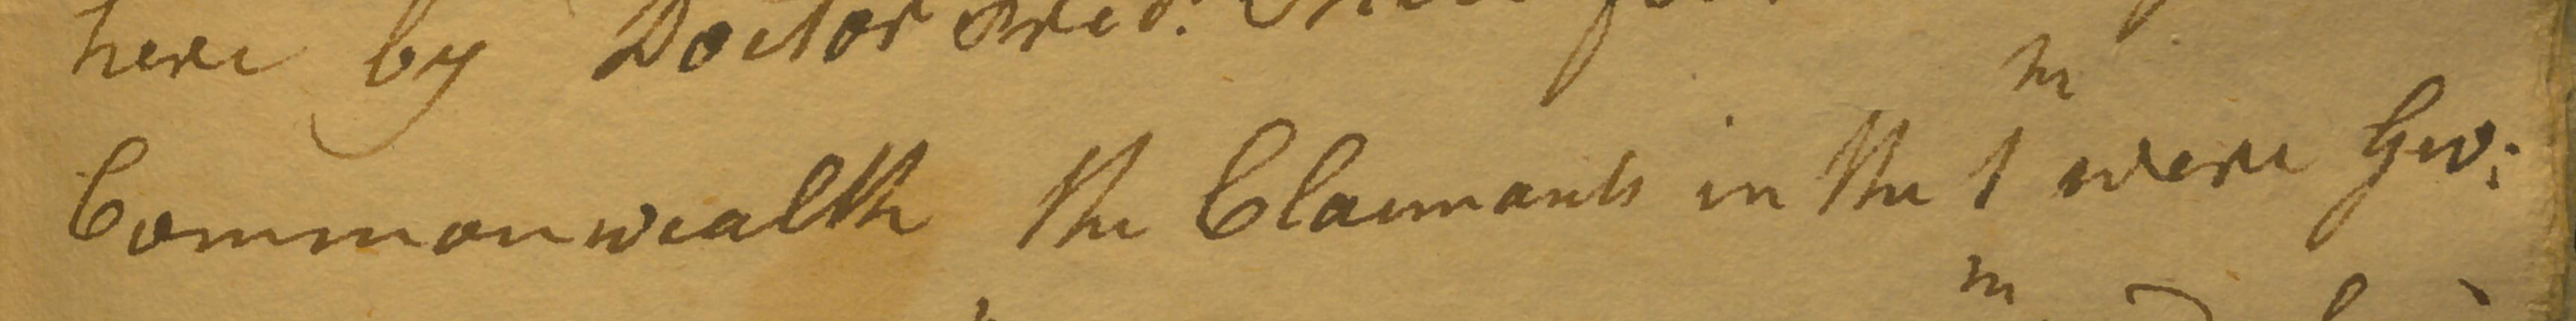Commonwealth the Claimants in the 1^th were Geo:
